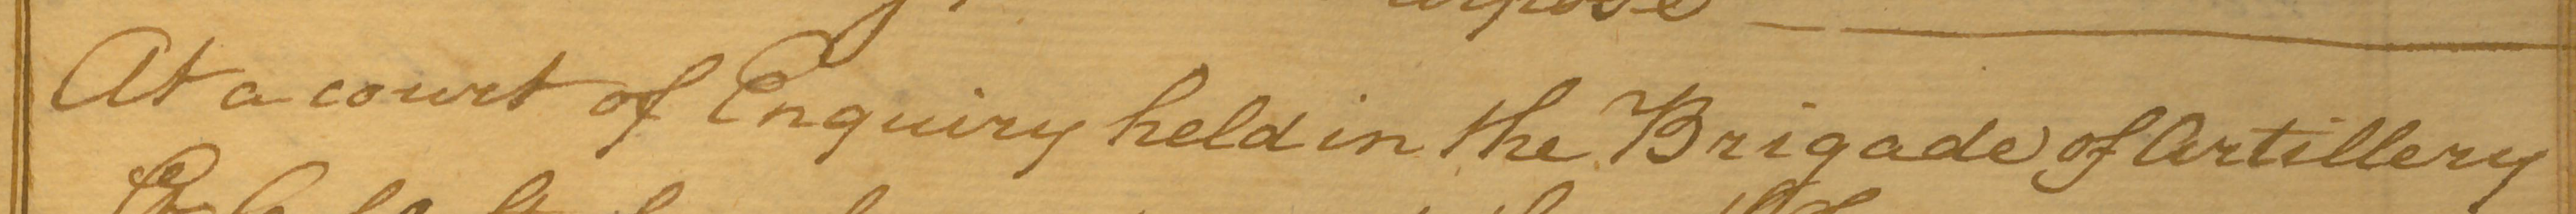At a court of Enquiry held in the Brigade of Artillery
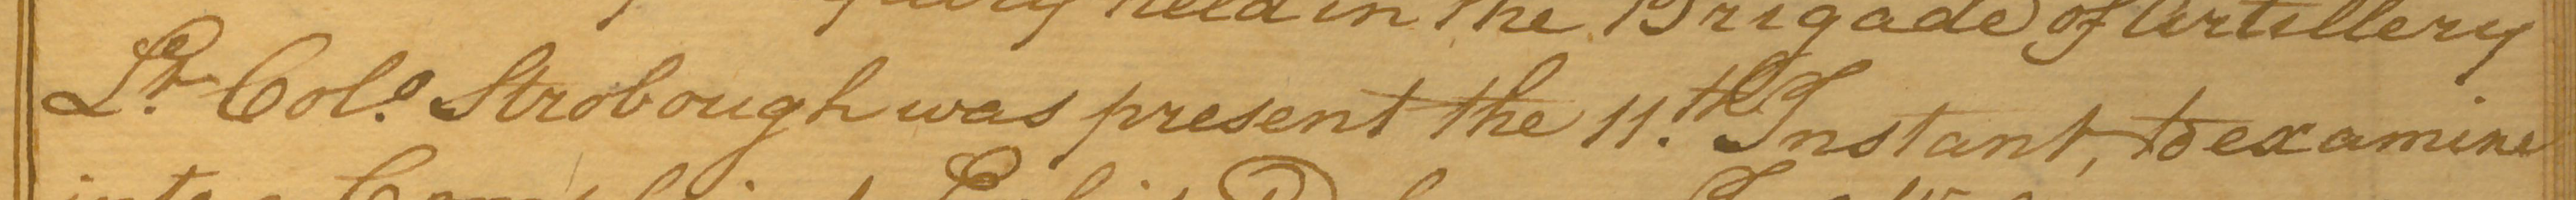L^t. Col^o. Strobough was present the 11^th. Instant, to examine
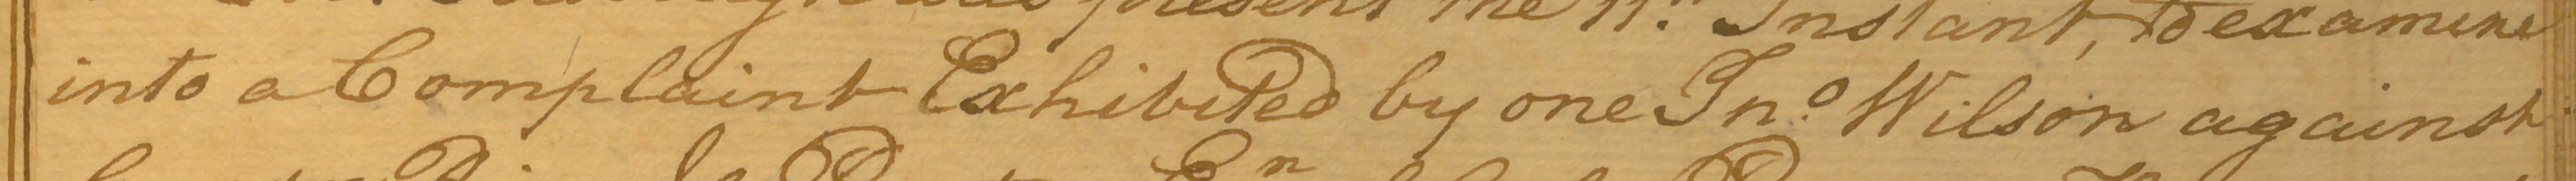into a Complaint Exhibited by one Jn^o. Wilson against
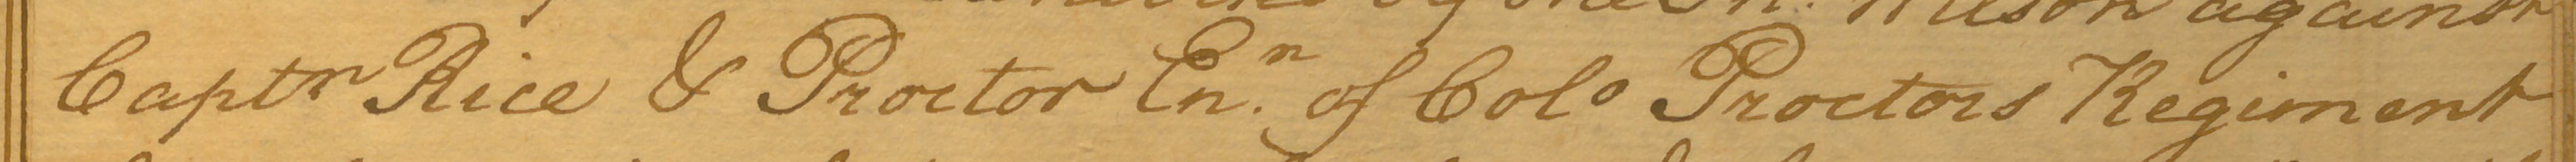Capt^n Rice & Proctor En^n. of Col^o Proctors Regiment
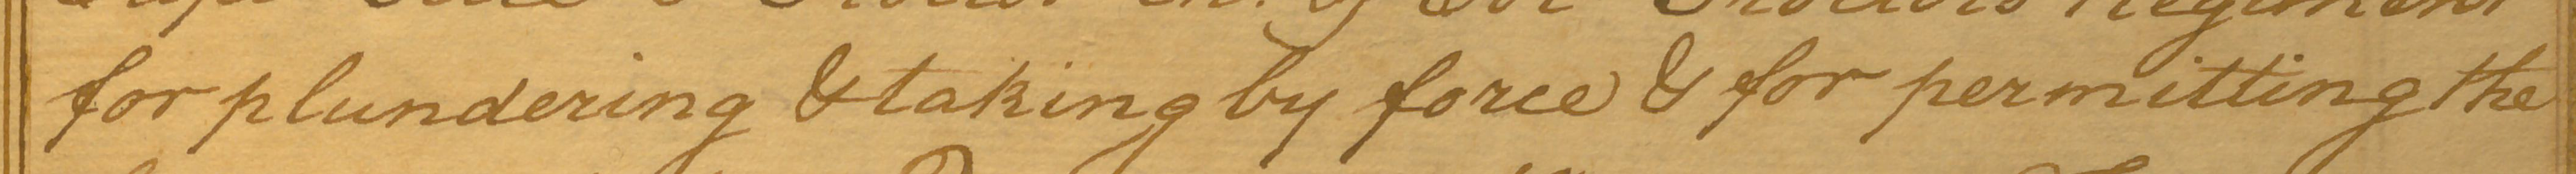for plundering & taking by force & for permitting the
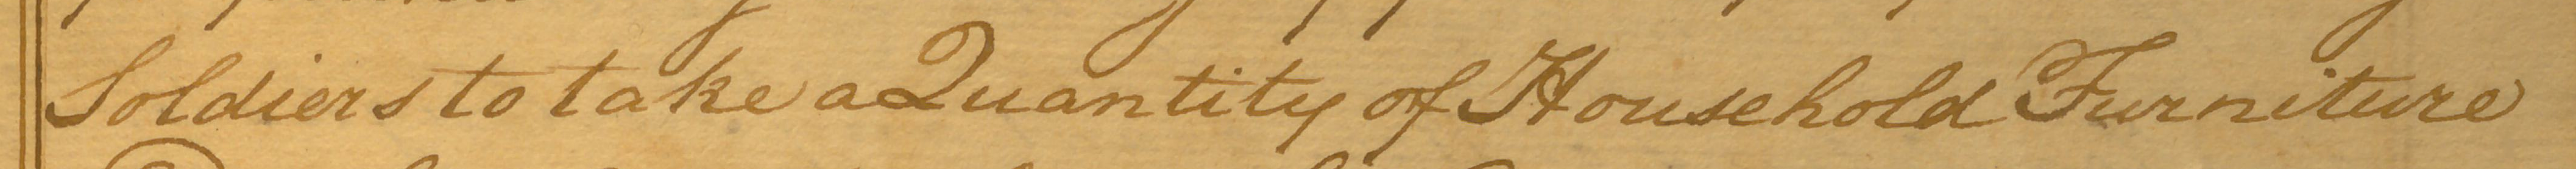Soldiers to take a Quantity of Household Furniture
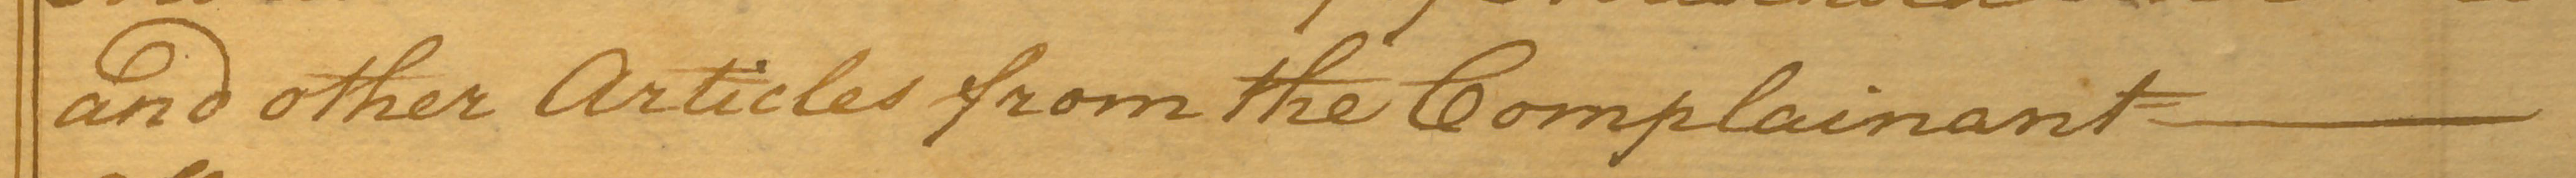and other Articles from the Complainant-
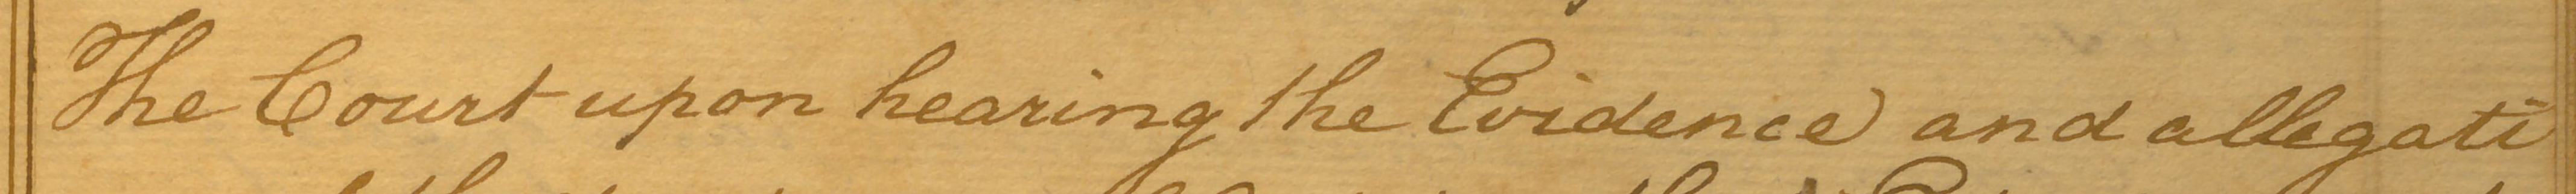The Court upon hearing the Evidence and allegati
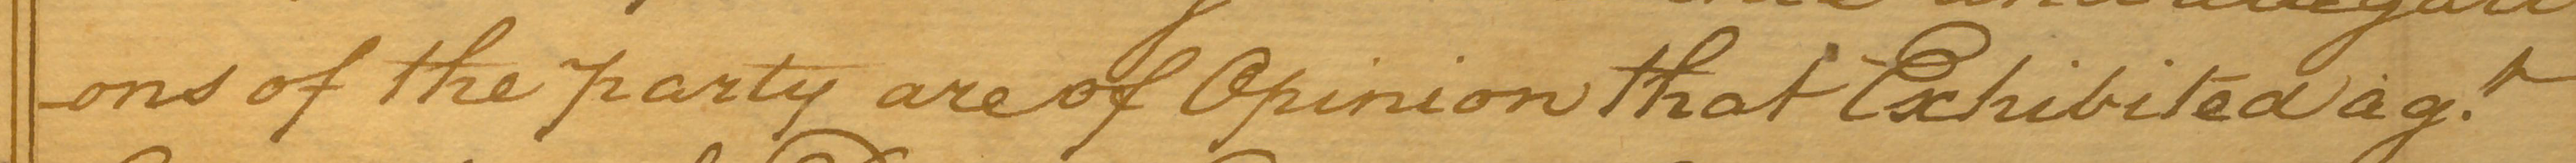-ons of the party are of Opinion that Exhibited ag^t.
